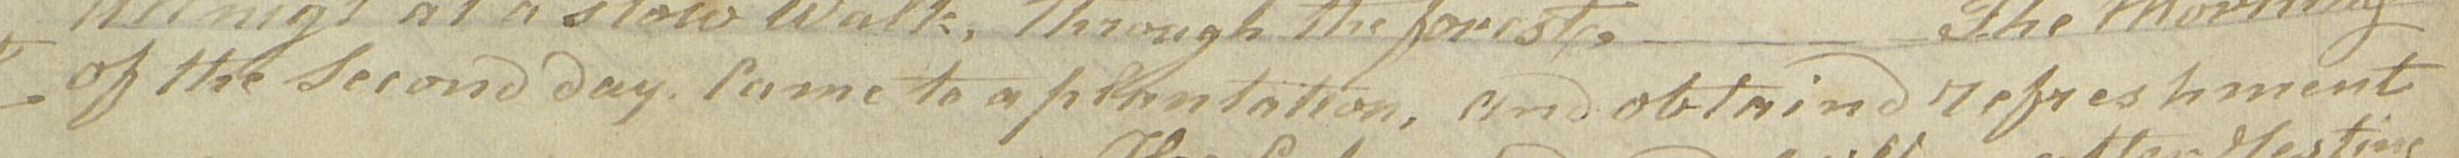of the second day Came to plantation, and obtaind refreshment
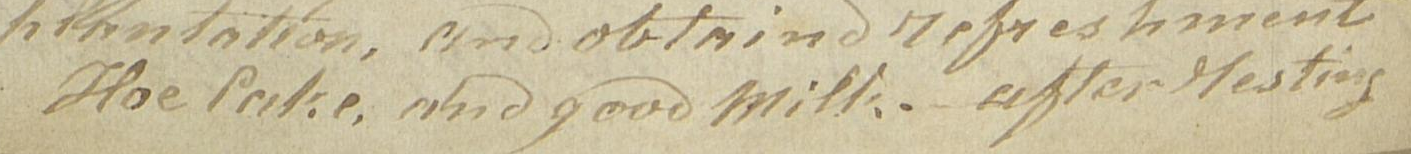Hoe Cake, and good Mill. after resting
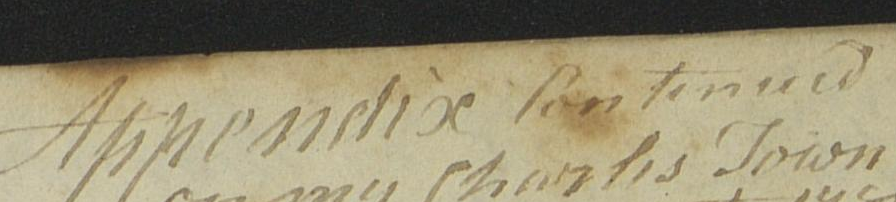Appendix Continued
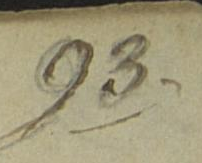93
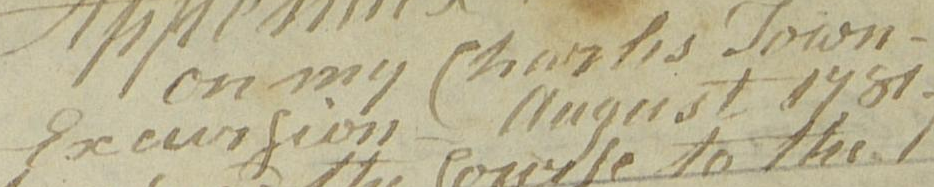Excursion August 1781
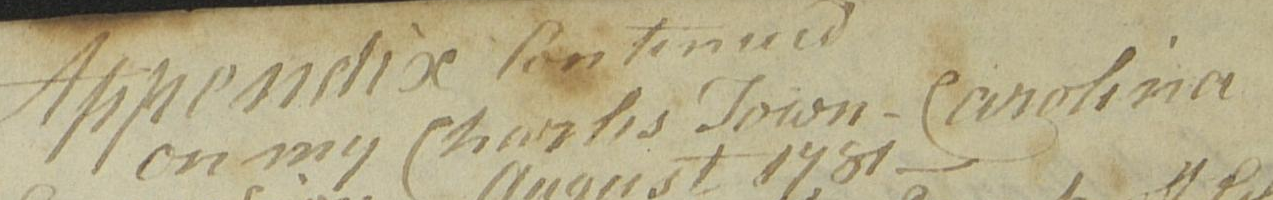on my Charles Town, Carolina
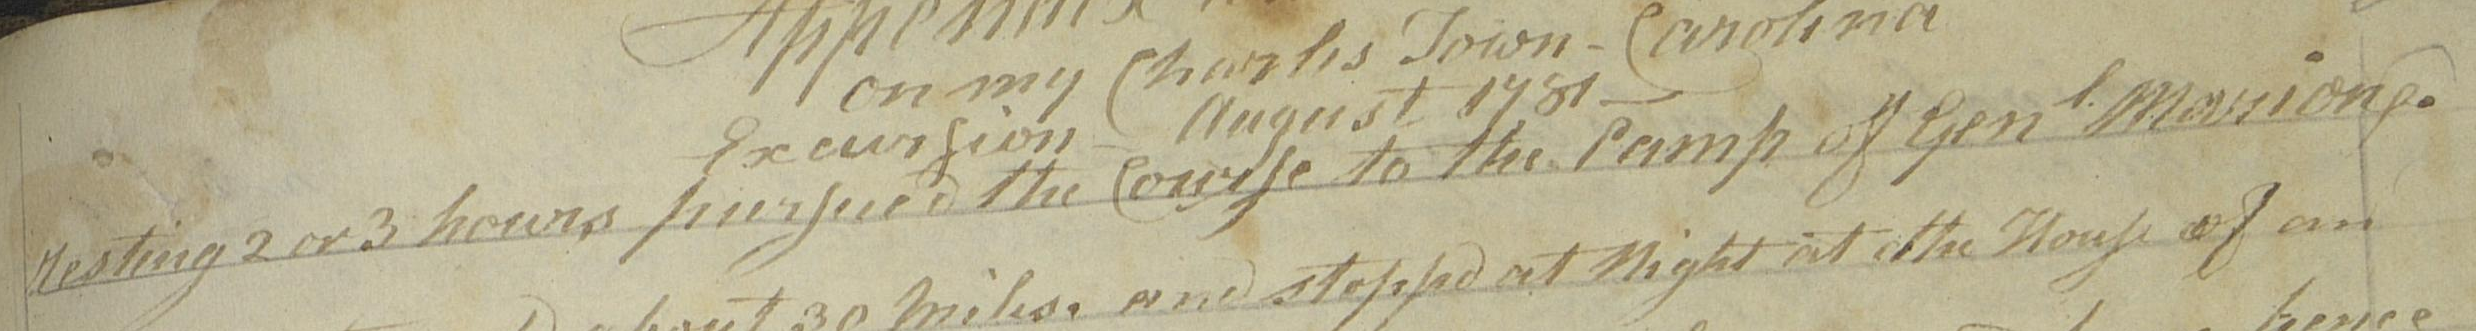resting 2 or 3 hours pursued the course to the Camp of Gen^l. Marion.
